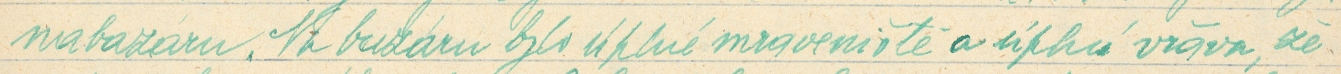na bazáru. Na bazáru bylo úplné mraveniště a úplná vřava, že
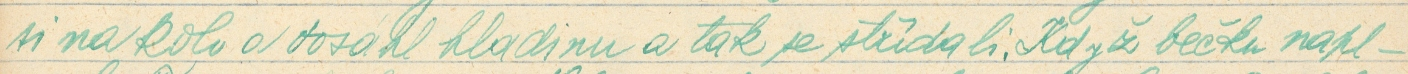si na kolo a dosáhl hladinu a tak se střídali. Když bečku napl-
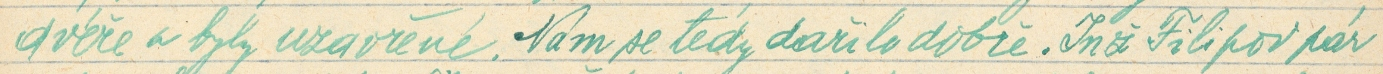dvéře a byly uzavřené. Nám se tedy dařilo dobře. Inž Filipov pár
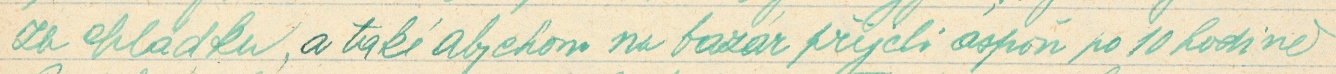za chládku, a také abychom na bazár přijeli aspoň po 10 hodině.
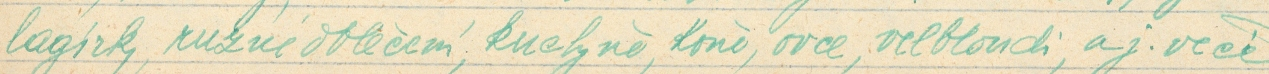lagírky, ruzné oblečení, kuchyně, koně, ovce, velbloudi, a j. věcí
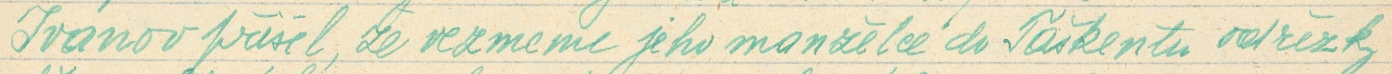Ivanov přišel, že vezmeme jeho manželce do Taškentu odřezky
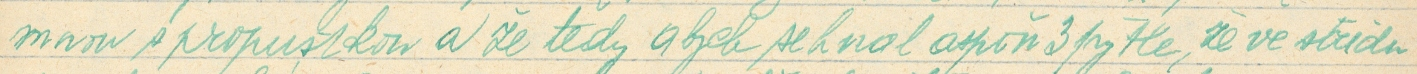mnou s propustkou a že tedy abych sehnal aspoň 3 pytle, že ve středu
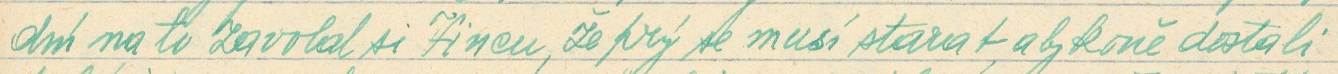dní na to zavolal si Vincu, že prý se musí starat, aby koně dostali
